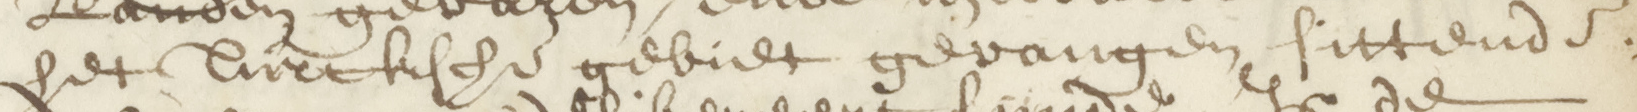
het Turcksche gebiet gevangen sittende:
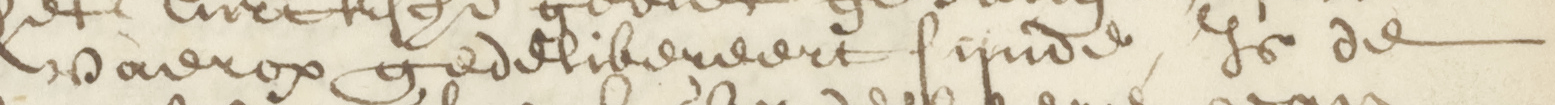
Waerop gedelibereert sijnde, Is de
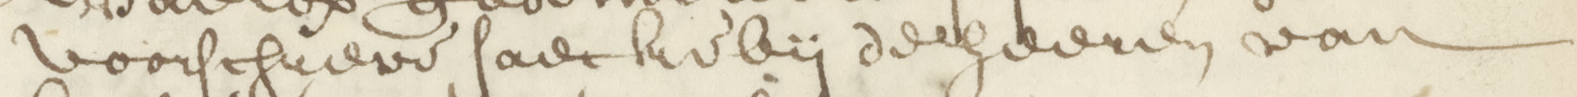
voorschreve saecke bij de heeren van
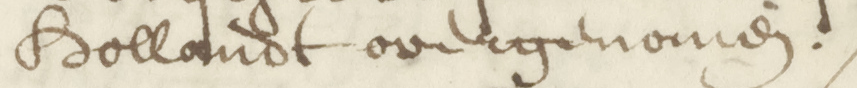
Hollandt overgenomen.
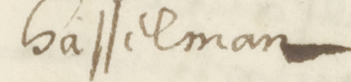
Hasselman
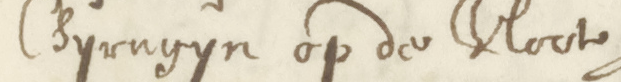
Chyrugyn op de Vloote
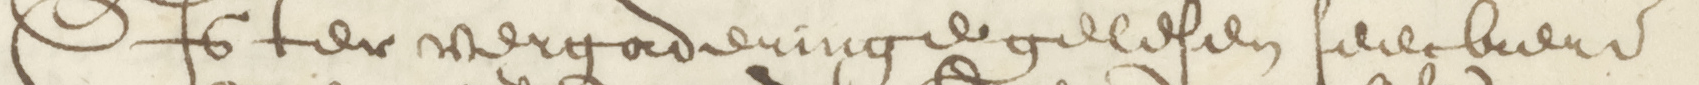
Is ter vergaderinge gelesen seeckere
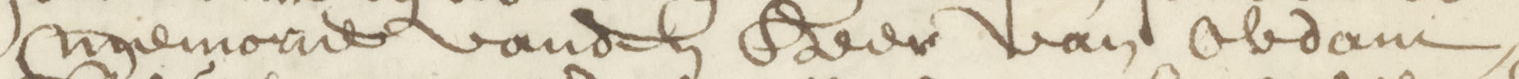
memorie vanden Heer van Obdam,
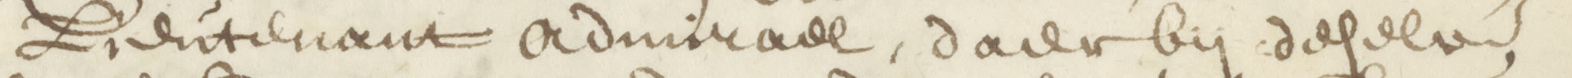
Lieutenant Admirael, daer bij deselve
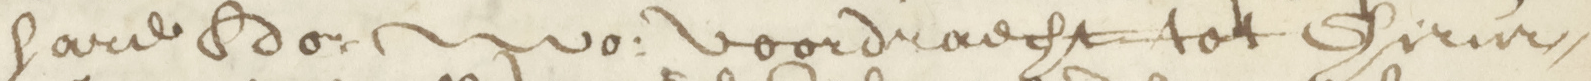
hare Ho:Mo: voordraecht tot Chirur„
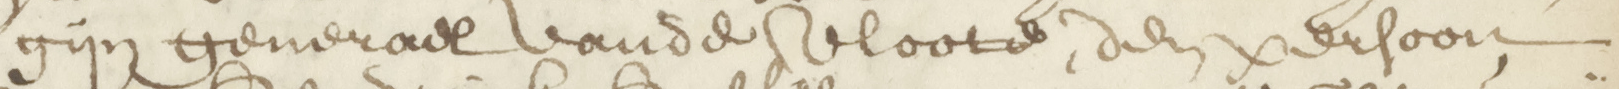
gijn Generael vande Vloote, den persoon
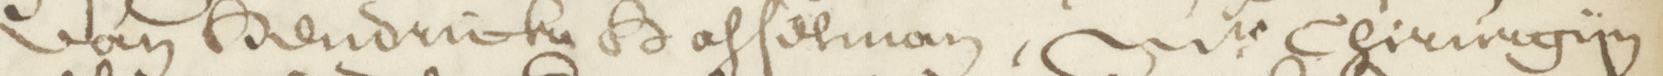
van Hendrick Hasselman, Mr. Chirurgijn
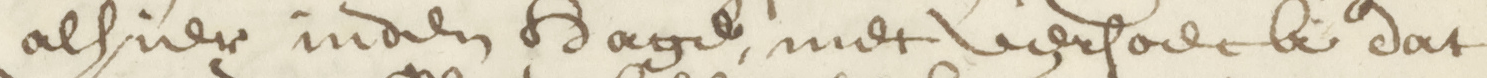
alhier inden Hage, met versoeck dat
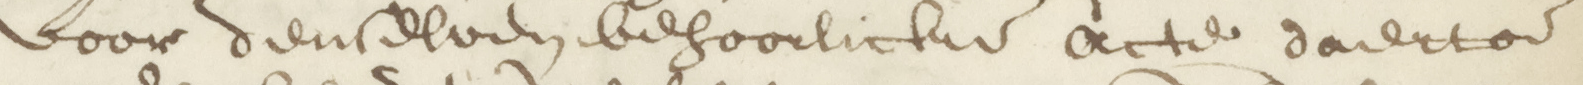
voor denselven behoorlicke Acte daertoe
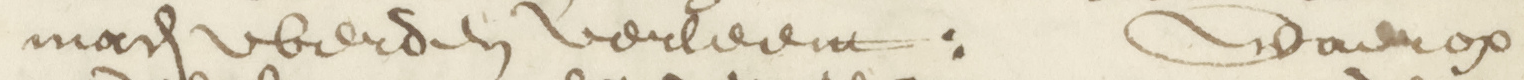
mach werden verleent: Waerop
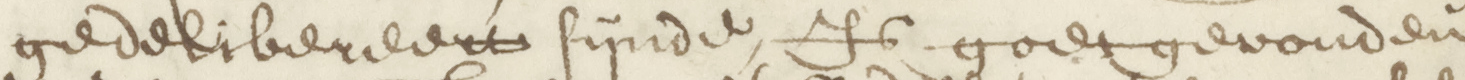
gedelibereert sijnde, Is goetgevonden
